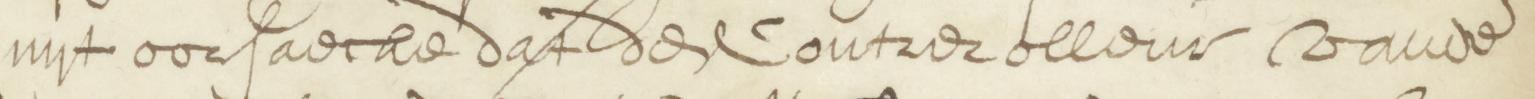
uyt oorsaecke dat de Contrerolleur vande
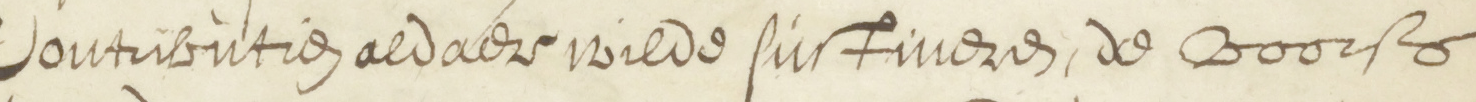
Contributien aldaer wilde sustineren, de voorss
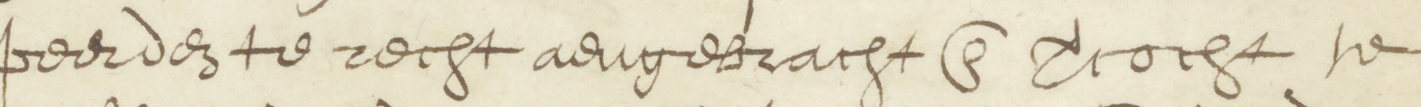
peerden te recht aengebracht & vcocht te
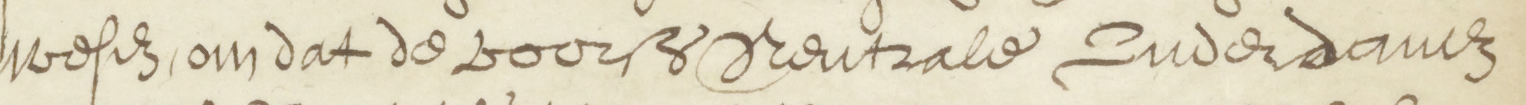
wesen, om dat de voorss Neutrale Onderdanen
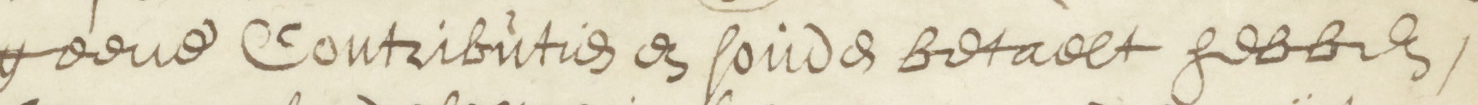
geene Contributien en souden betaelt hebben,
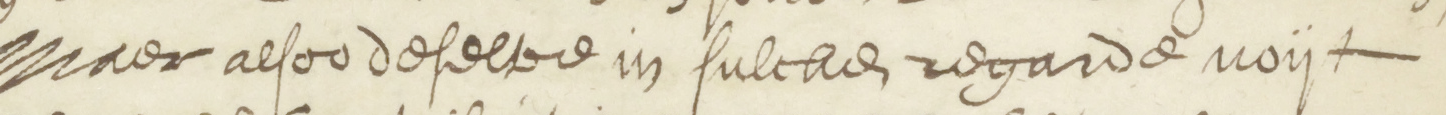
Maer alsoo deselve in sulcken regarde noijt
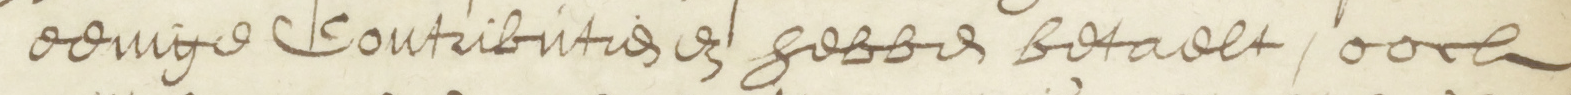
eenige Contributien en hebben betaelt, oock
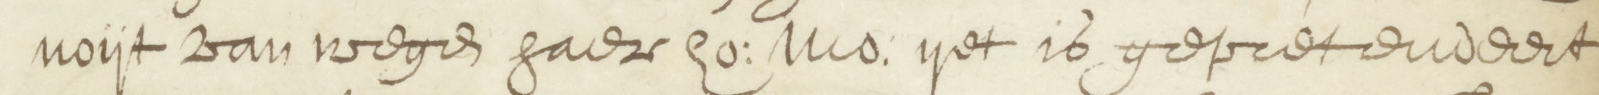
noijt van wegen haer ho:Mo: yet is gepretendeert
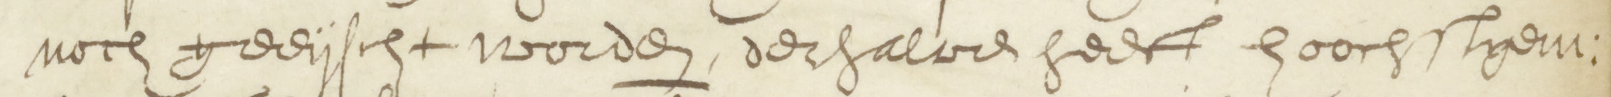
noch geeijscht worden, derhalve heeft hoochstgem:
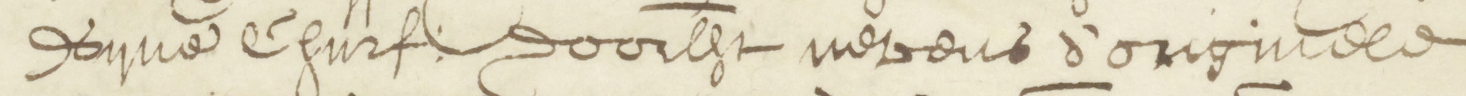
Sijne Churf: Doorlht. nevens d‛originele
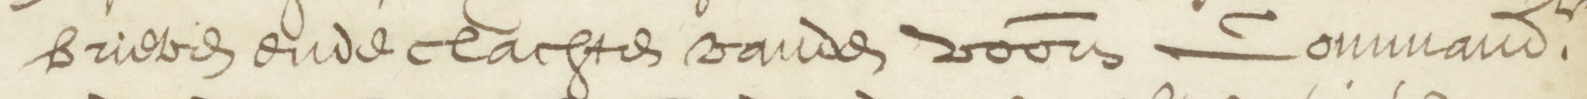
brieven ende clachten vanden voors Commandr.
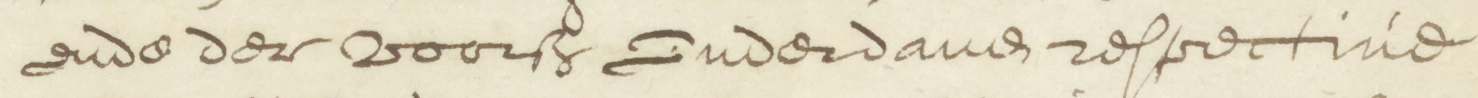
ende der voorss Onderdanen respectiue
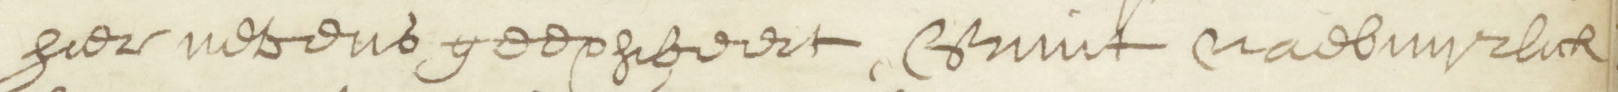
hier nevens geexhibeert, vrunt naebuyrlick
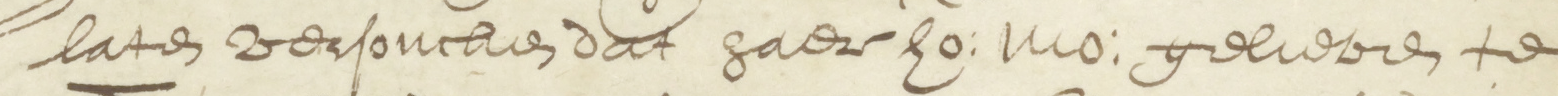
laten versoucken dat haer ho:Mo: gelieven te
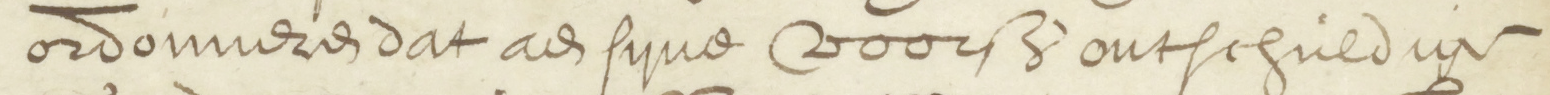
ordonneren dat aen sijne voorss ontschuldige
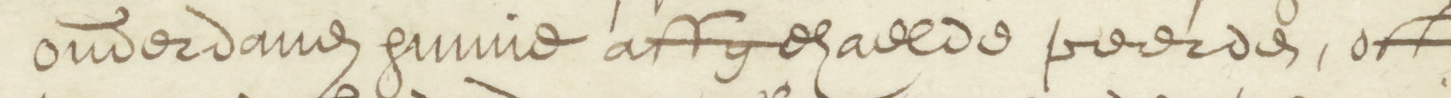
onderdanen hunne affgehaelde peerden, off
